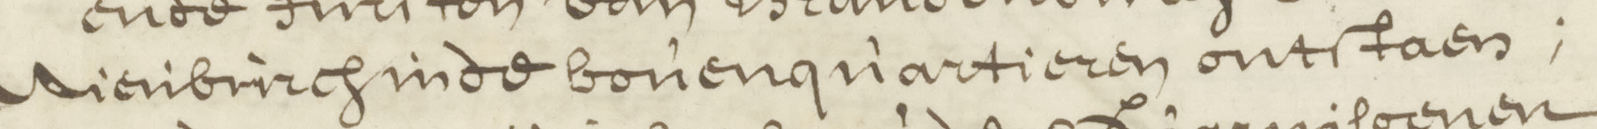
Nieuburch inde bouenquartieren ontstaen;
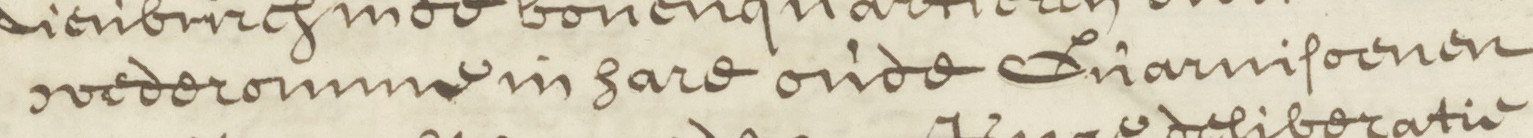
wederomme in hare oude Guarnisoenen
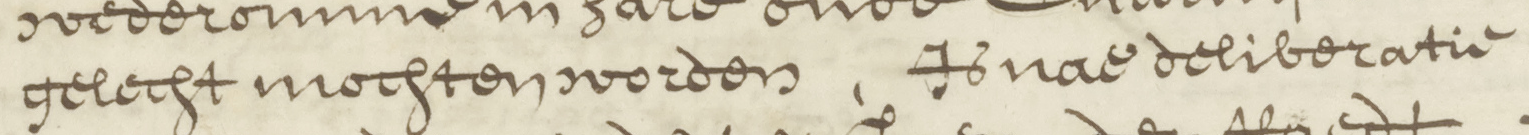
gelecht mochten worden, Is nae deliberatie
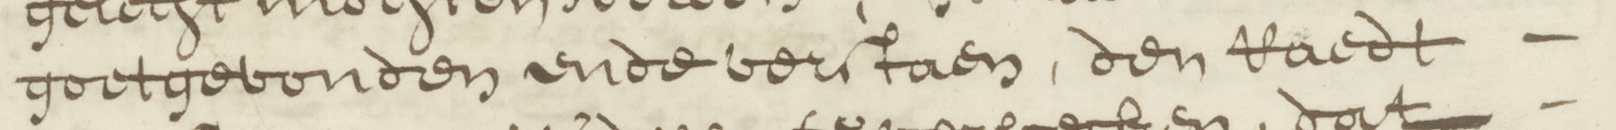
goetgevonden ende verstaen, den Raedt -
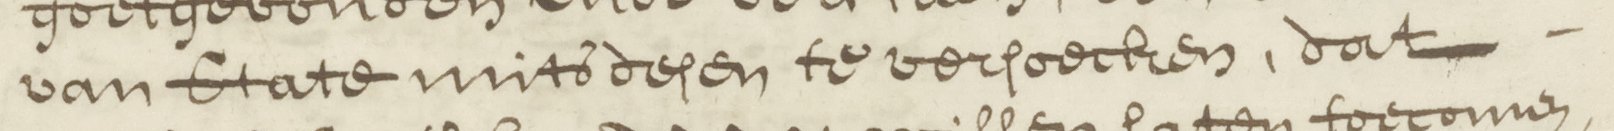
van State mitsdesen te versoecken, dat -
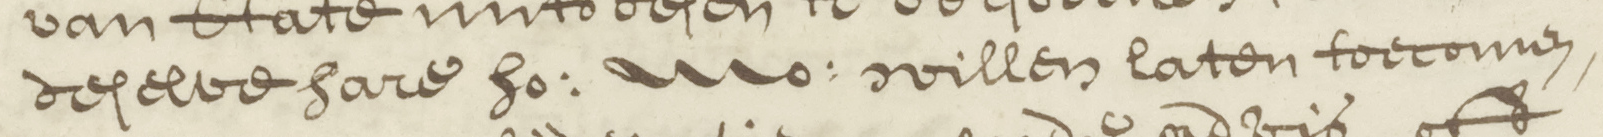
deselve hare ho:Mo: willen laten toecomen,
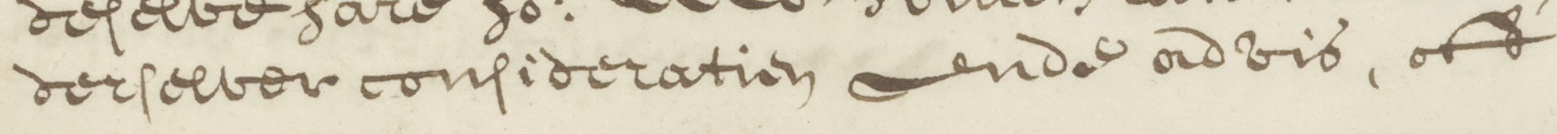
derselver consideratien ende advis, off
